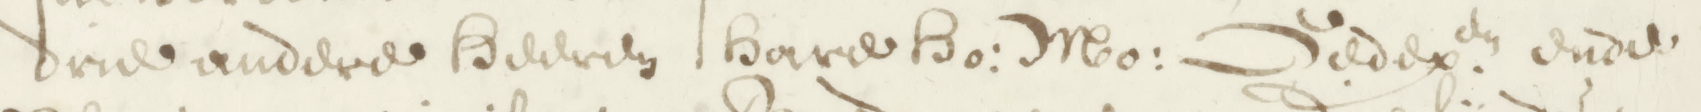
drie andere heeren hare Ho:Mo: Gedepen. ende
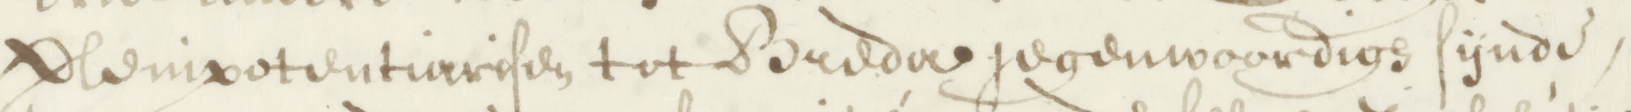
Plenipotentiarisen tot Breda jegenwoordigh sijnde,
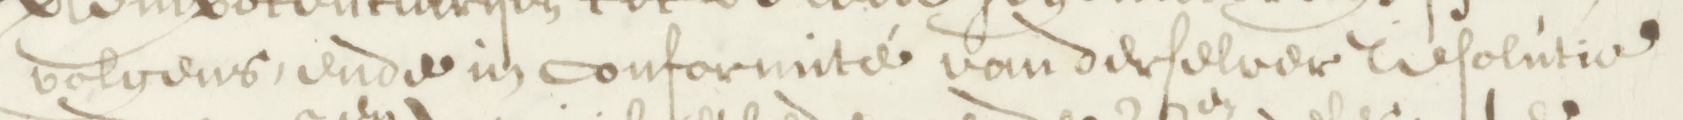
volgens, ende in conformité van derselver Resolutie
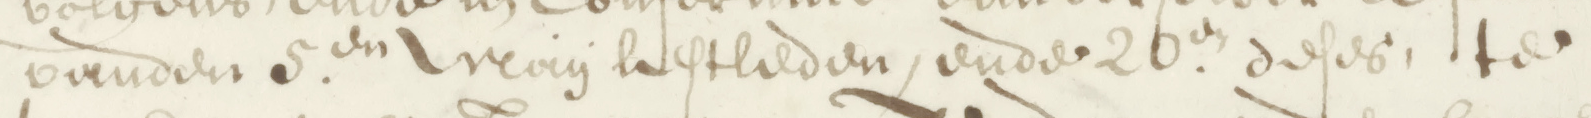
vanden 5en. Maij lestleden, ende 20en. deses, te
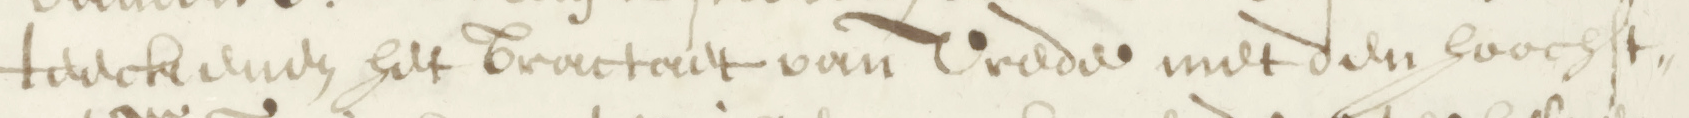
teeckenen het Tractaet van Vrede met den hoochst„
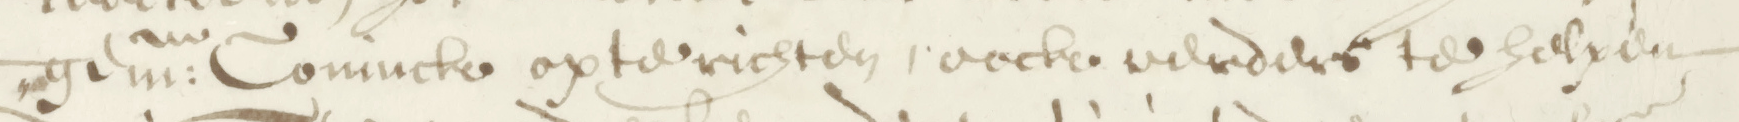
„gem: Coninck opte richten, oock verders te helpen
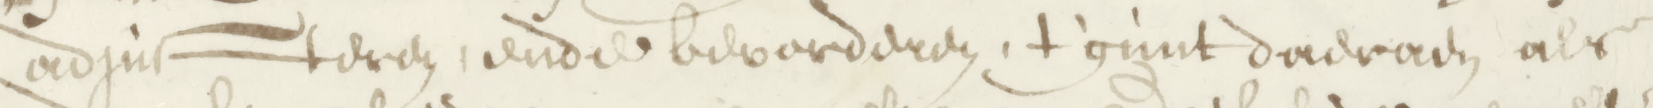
adjusteren, ende bevorderen, t'gunt daeraen als
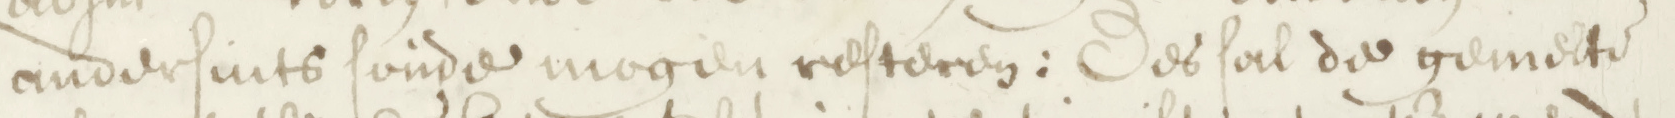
andersints soude mogen resteren: Des sal de gemelte
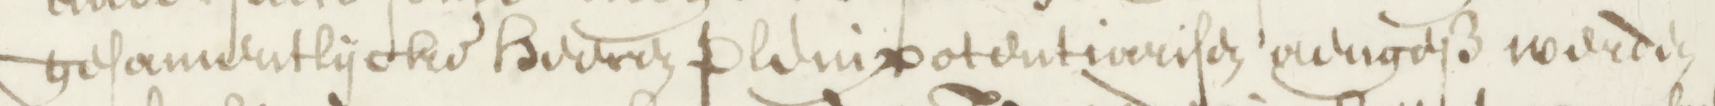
gesamentlijcke heeren Plenipotentiarisen aenges werden
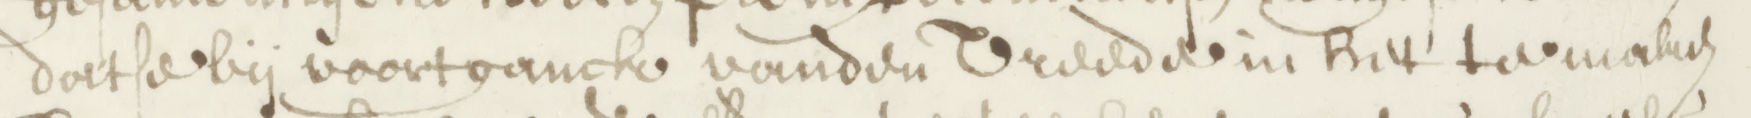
datse bij voortganck vanden Vreede in het te maken
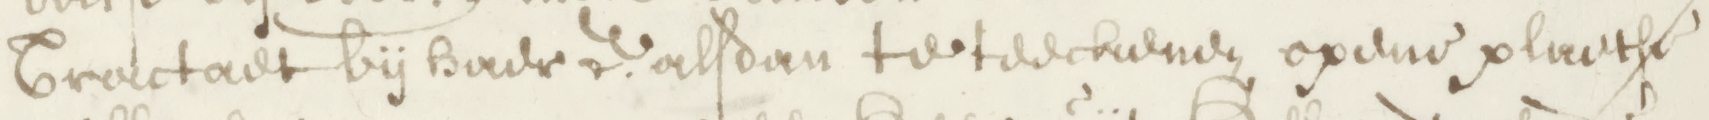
Tractaet bij haer E. alsdan te teeckenen opene plaetse
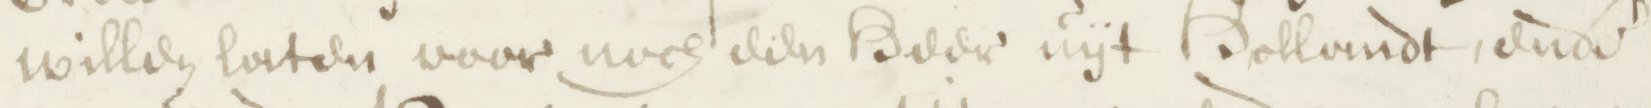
willen laten voor noch een heer uijt Hollandt, ende
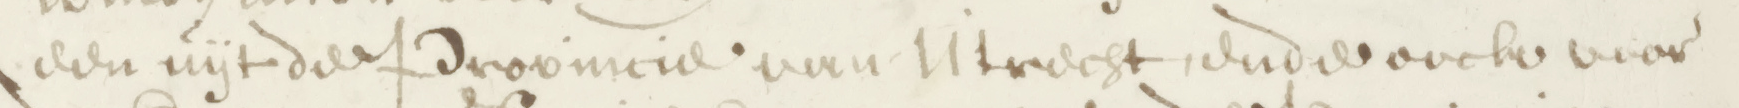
een uijt de Provincie van Utrecht, ende oock voor
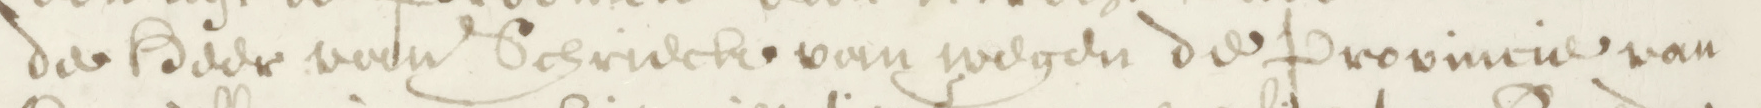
de Heer van Schrieck van wegen de Provincie van
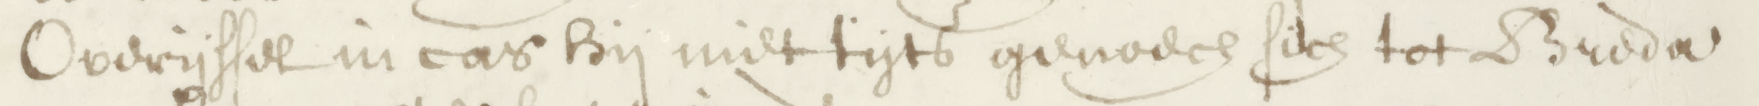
Overijssel in cas hij niet tijts genoech sich tot Breda
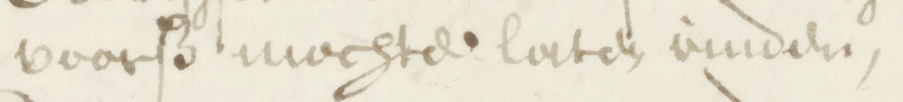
voors mochte laten vinden,
